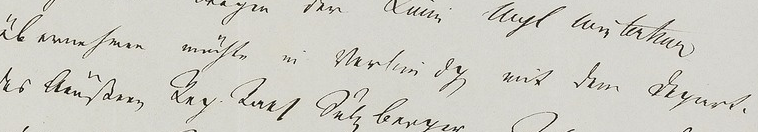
übernehmen möchte in Verbindg mit dem Depart.
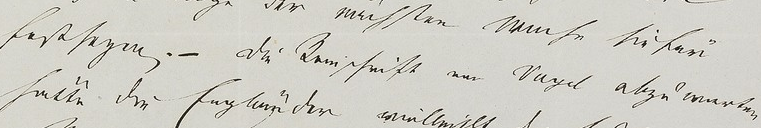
festsezen. – Die Reinschrift von Vogel abzuwarten
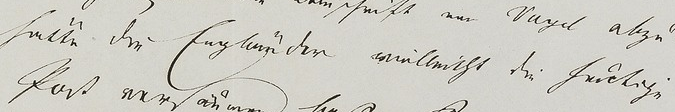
hätte die Engländer vielleicht die heutige
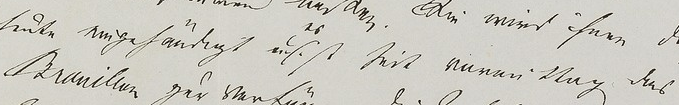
heute eingehändigt u. es ist seit vormittag das
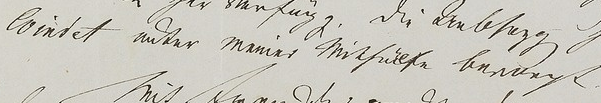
Coindet unter meiner Mithülfe besorgt.
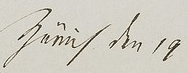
Zürich den 19
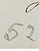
die
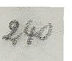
wieder
